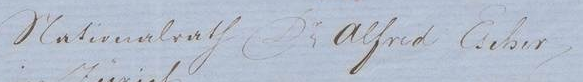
Nationalrath Dr Alfred Escher
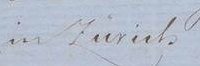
in Zürich.
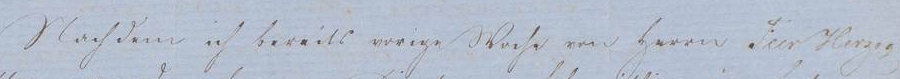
Nachdem ich bereits vorige Woche von Herrn Feer-Herzog
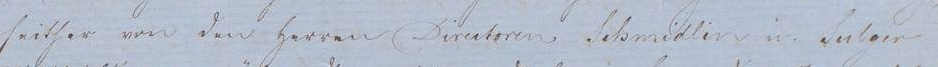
seither von den Herren Directoren Schmidlin u. Sulger
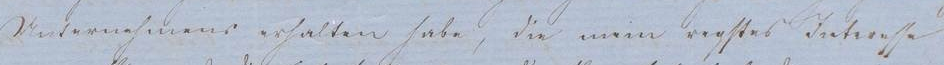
Unternehmens erhalten habe, die mein regstes Interesse
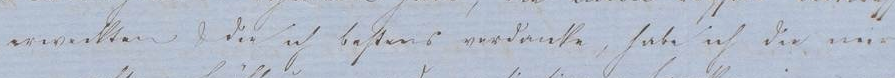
erweckten & die ich bestens verdanke, habe ich die mir
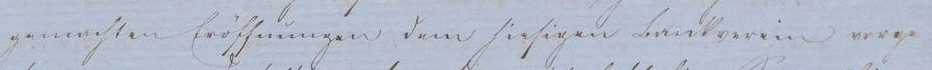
gemachten Eröffnungen dem hiesigen Bankverein vorge-
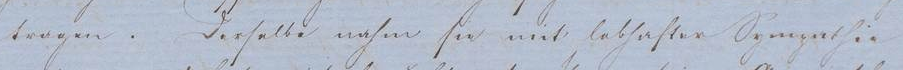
tragen. Derselbe nahm sie mit lebhafter Sympathie
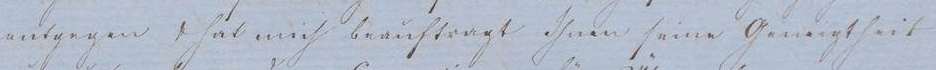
entgegen & hat mich beauftragt Ihnen seine Geneigtheit
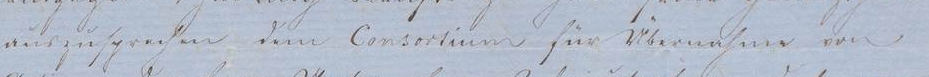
auszusprechen dem Consortium für Übernahme von
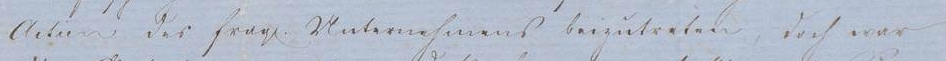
Actien des fragl. Unternehmens beizutreten, doch war
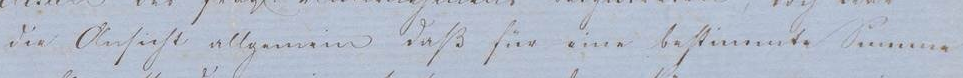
die Ansicht allgemein daß für eine bestimmte Summe
